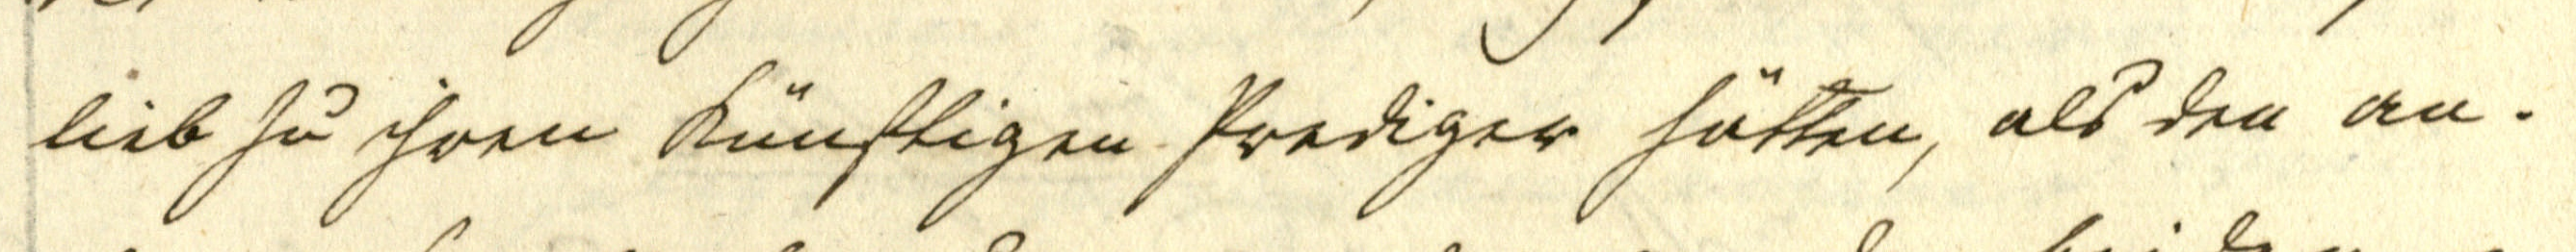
lieb zu ihren künftigen Prediger hätten, als den an¬
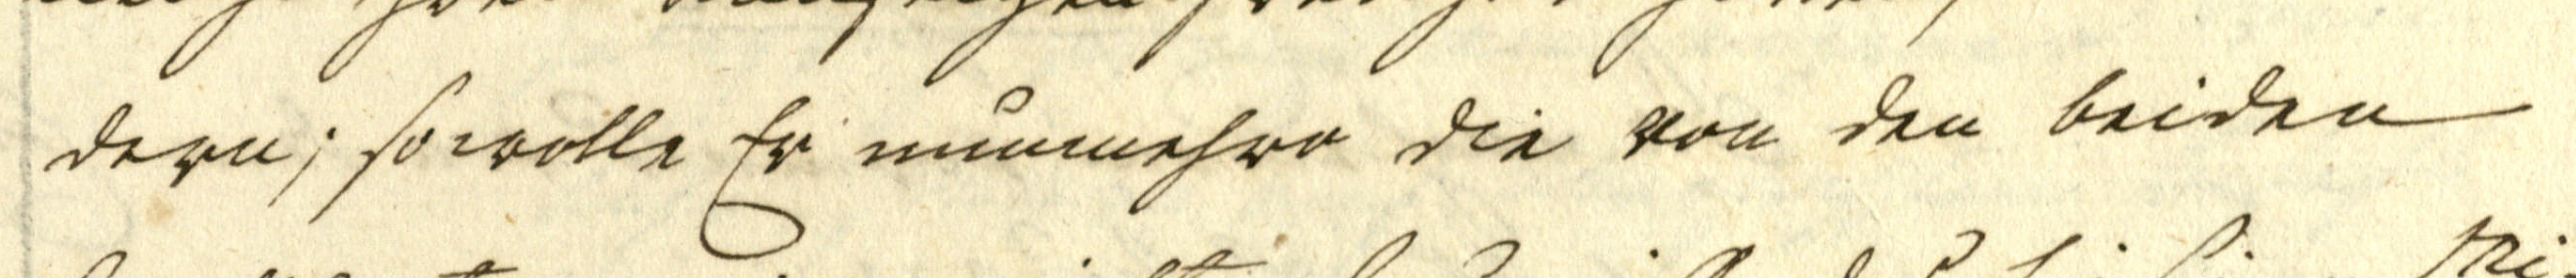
dern; so wolle Er nunmehro die von den beiden
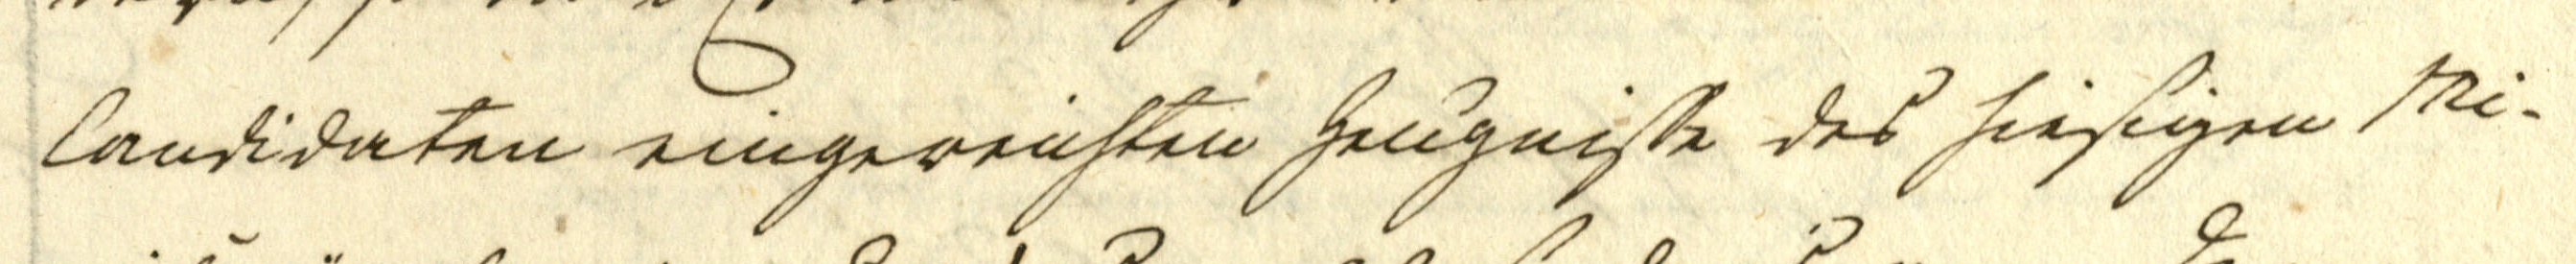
Candidaten eingereichten Zeugnisse des hiesigen Mi¬
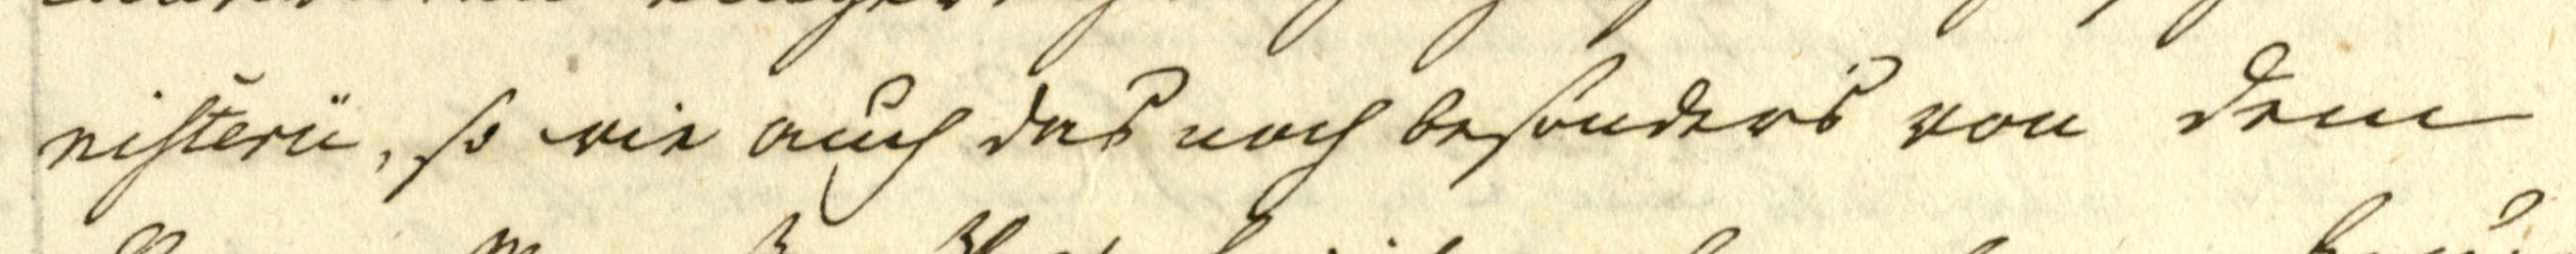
nisterii, so wie auch das noch besonders von dem
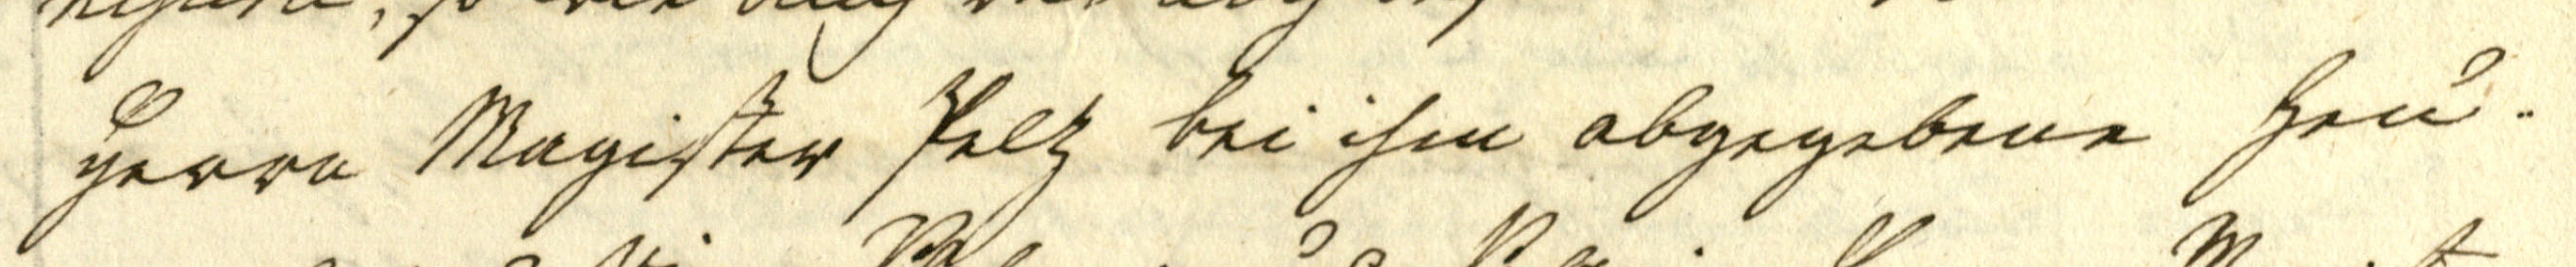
Herrn Magister Pelz bei ihm abgegebene Zeu¬
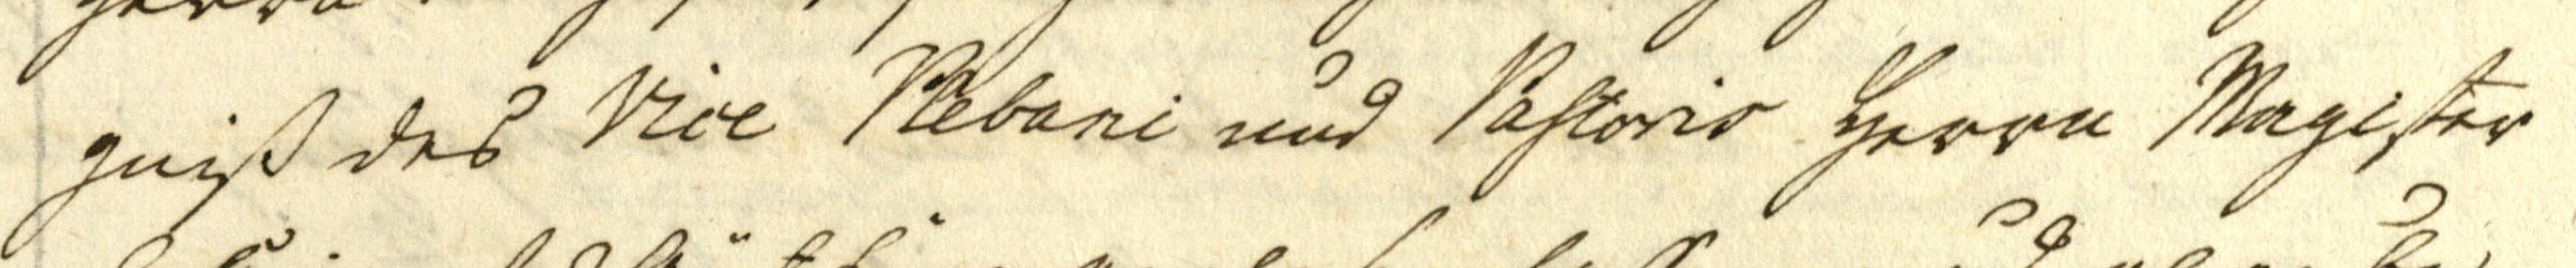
gniß des Vice Plebani und Pastoris Herrn Magister
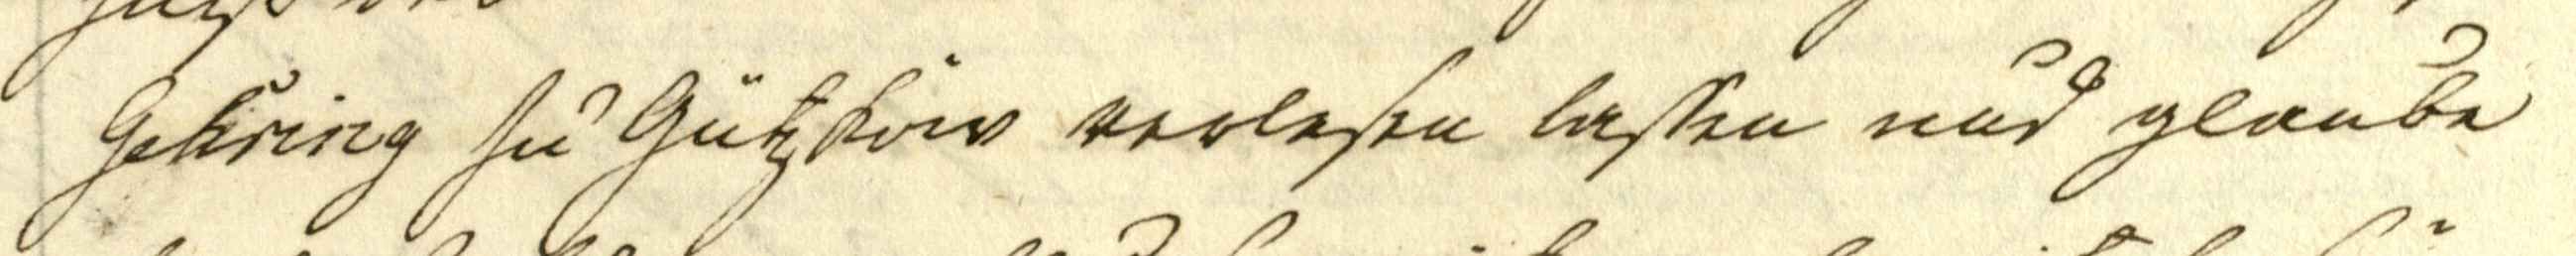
Gehring zu Gützkow verlesen lassen und glaube
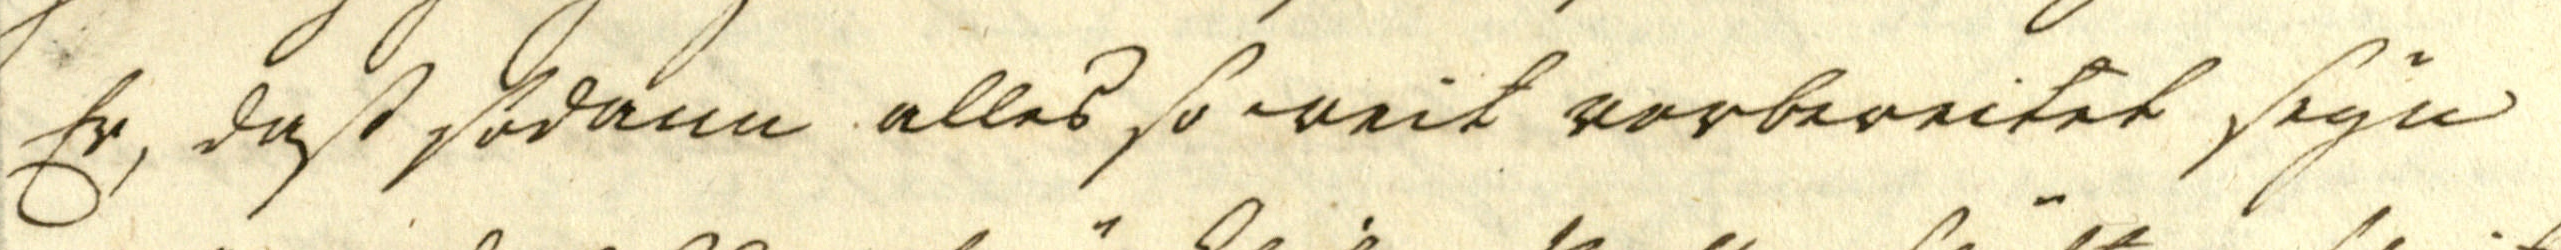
Er, daß sodann alles so weit vorbereitet seÿn
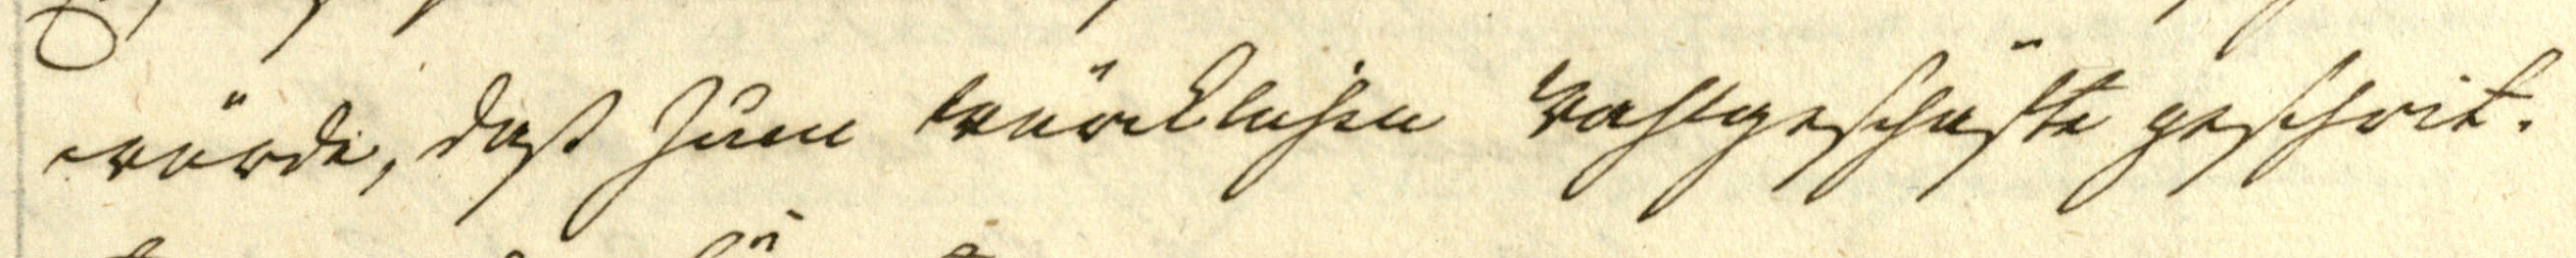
würde, daß zum würcklichen Wahlgeschäfte geschrit¬
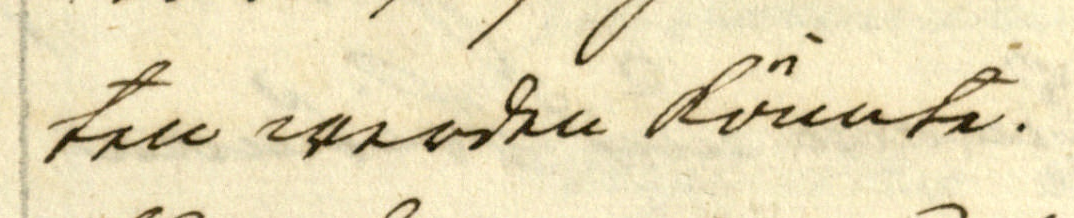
ten werden könnte.
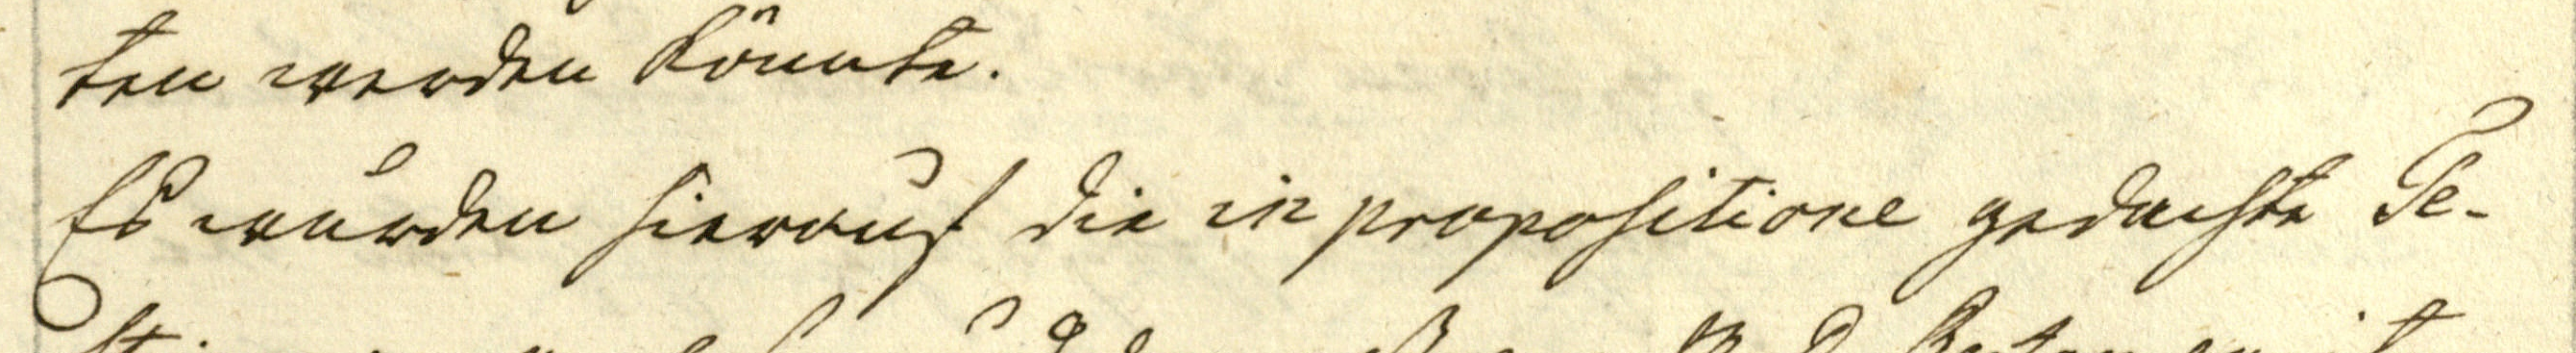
Es wurden hierauf die in propositione gedachte Te¬
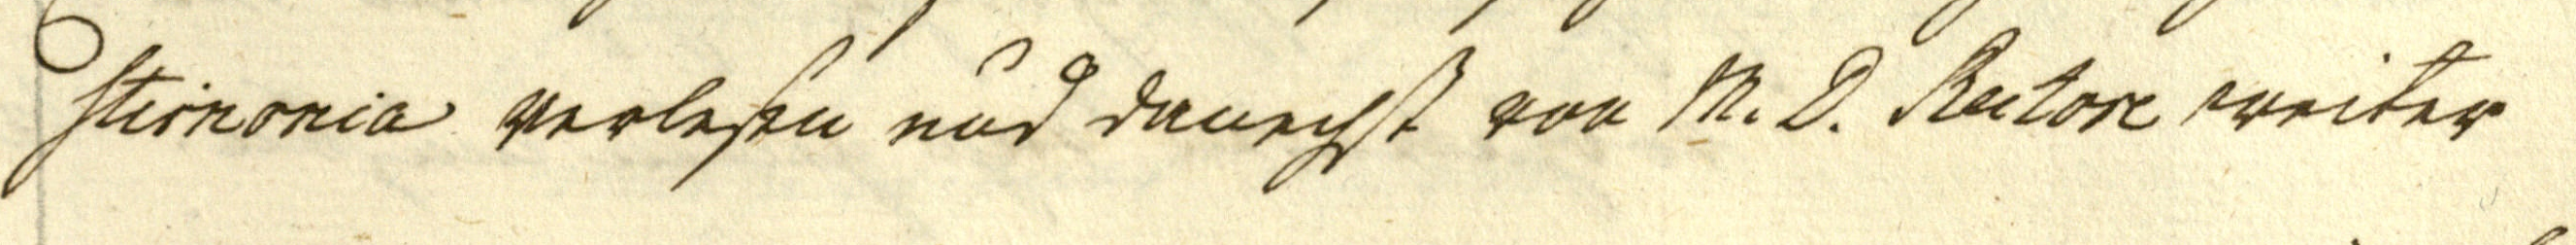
stimonia verlesen und danechst von M. D. Rectore weiter
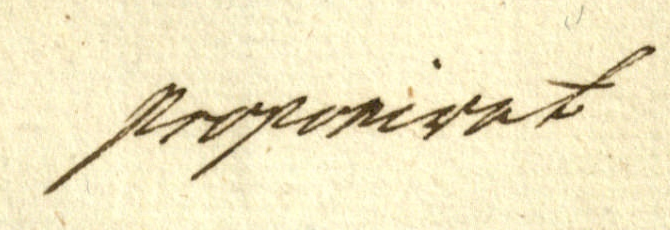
proponiret
